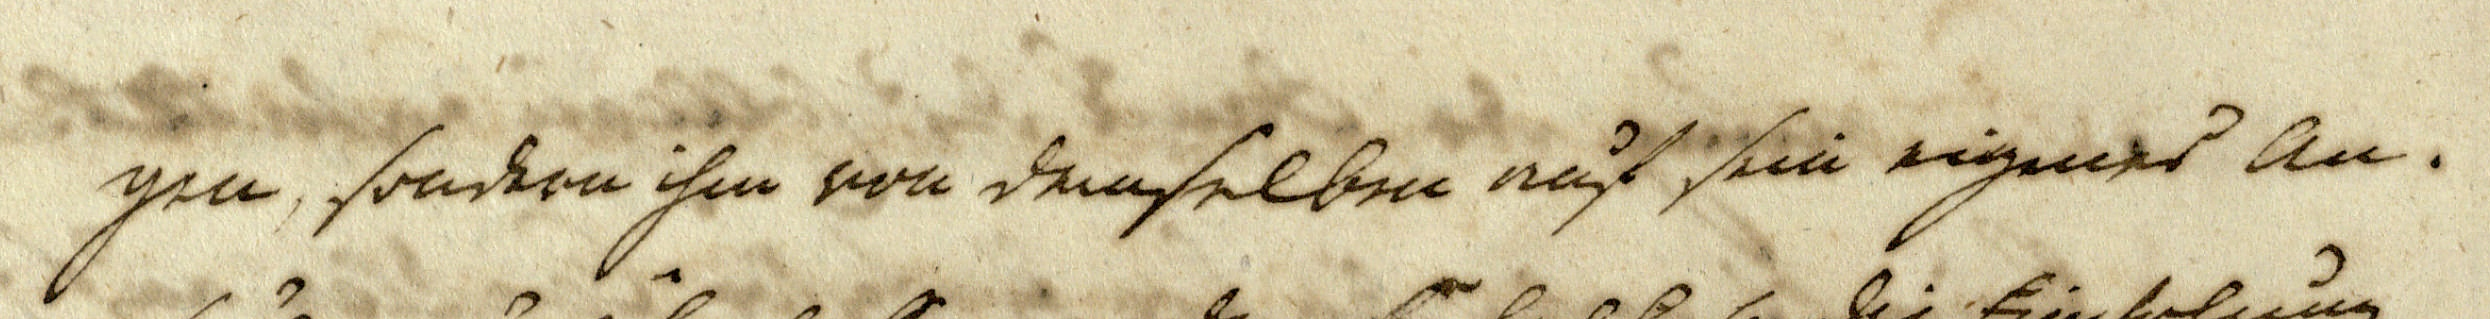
gen, sondern ihm von demselben auf sein eigenes An¬
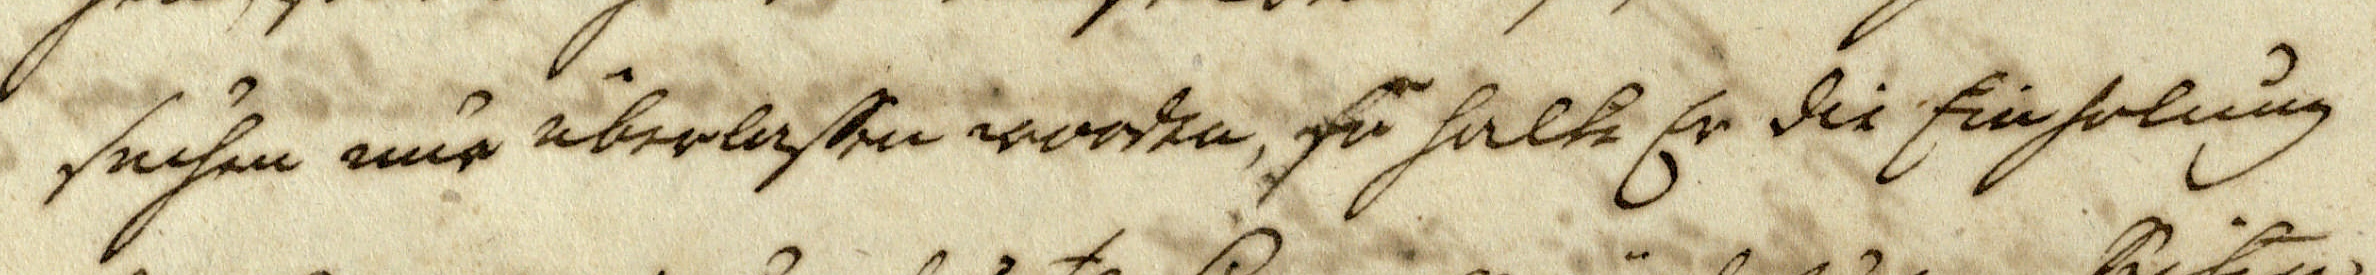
suchen nur überlassen worden, so halte Er die Einholung
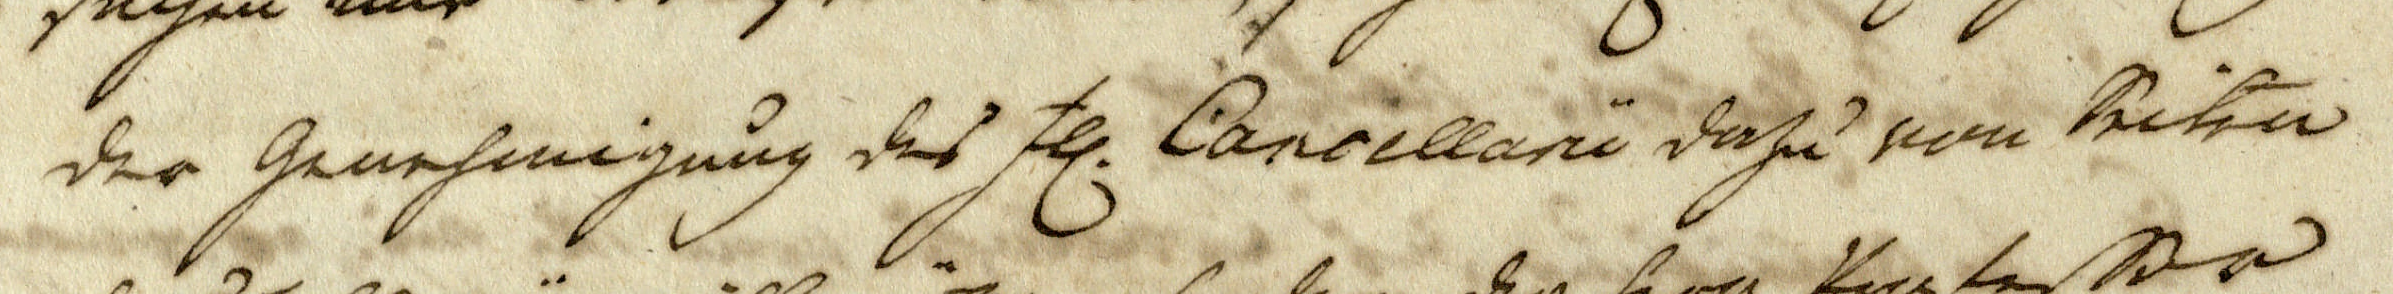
der Genehmigung des Ill. Cancellarii dazu von Seiten
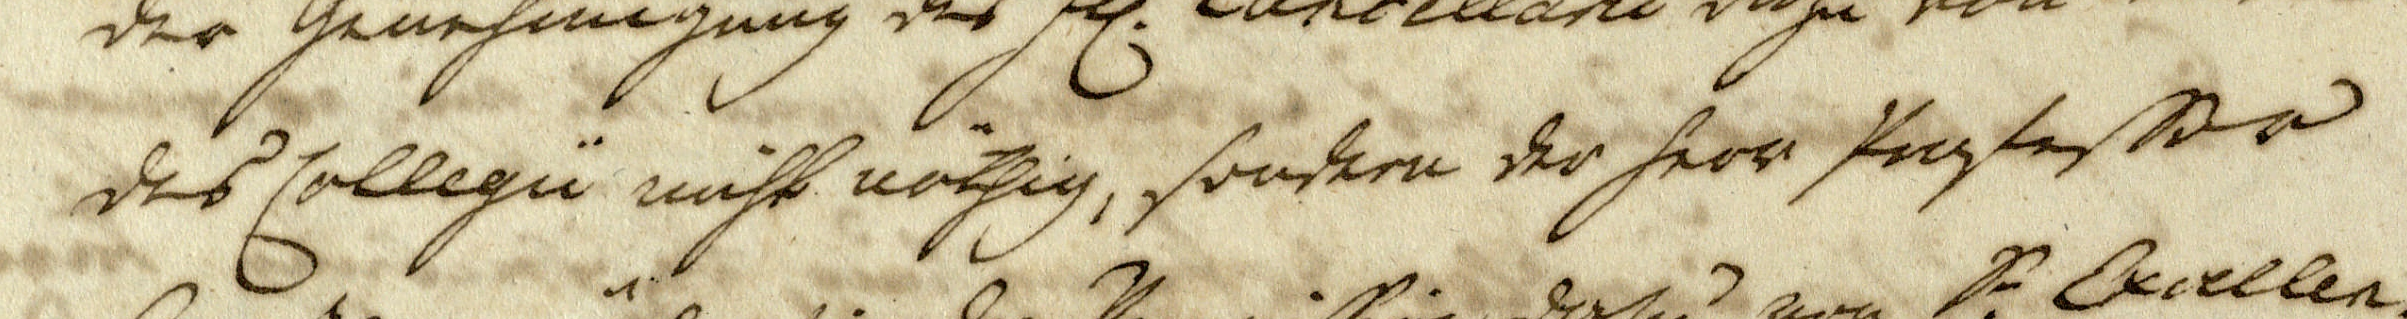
des Collegii nicht nöthig, sondern der Herr Professor
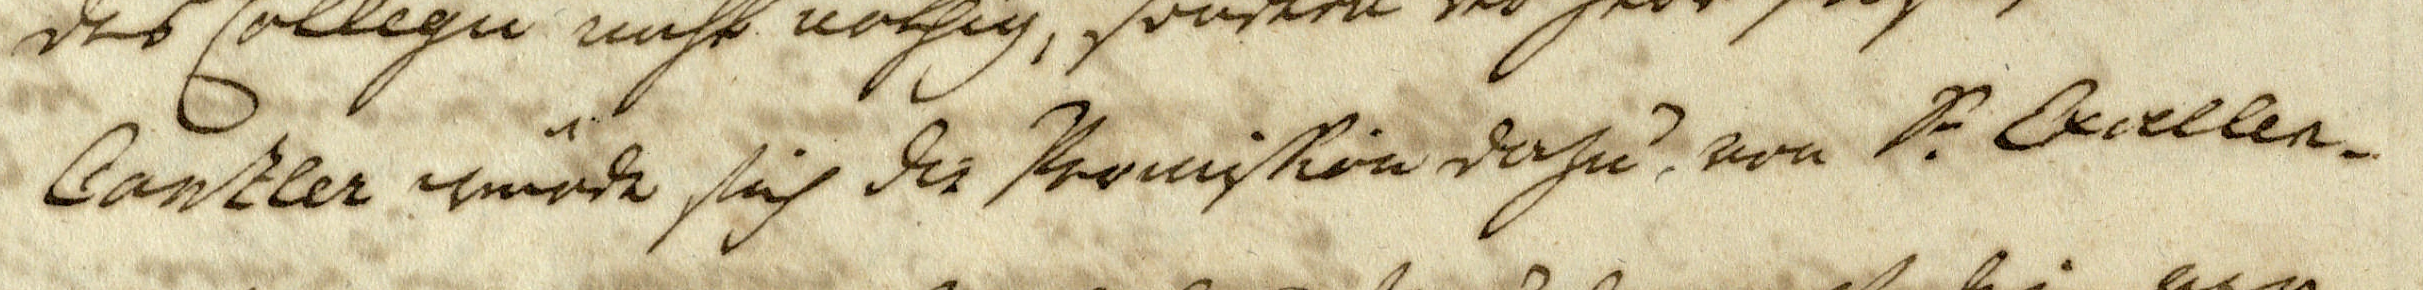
Canzler würde sich die Permission dazu von Sr Excellen¬
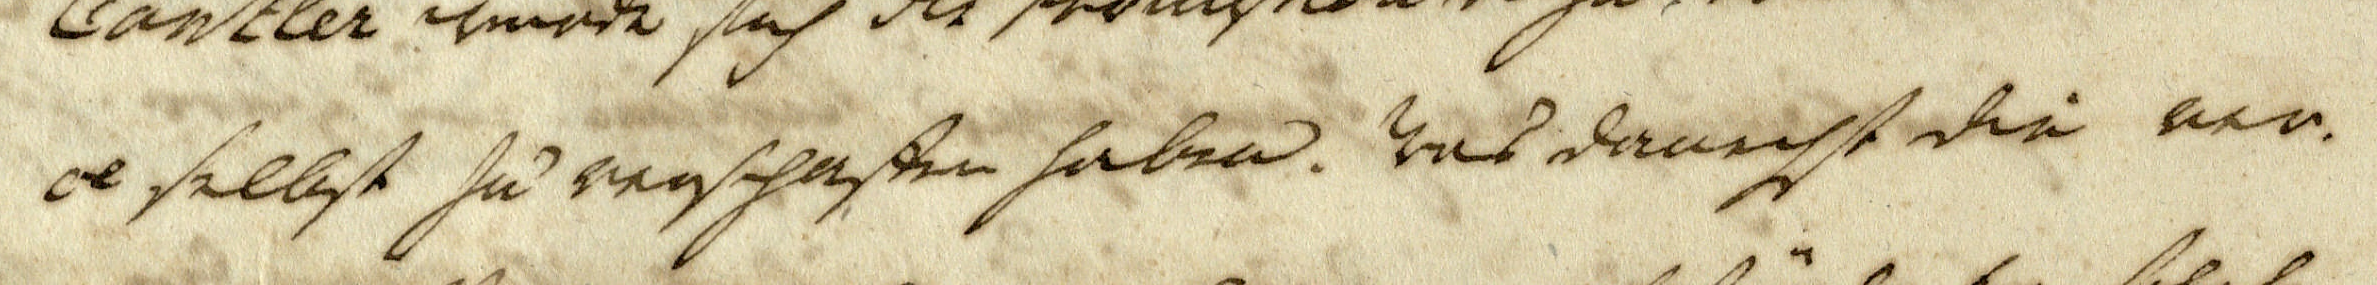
ce selbst zu verschaffen haben. Was danechst die ver¬
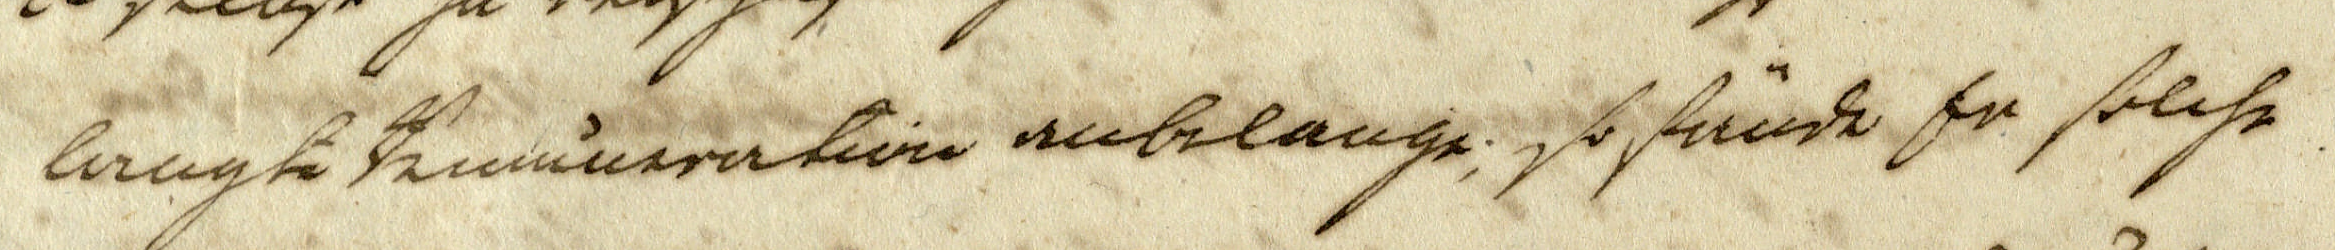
langte Remuneration anbelange, so fände Er solche
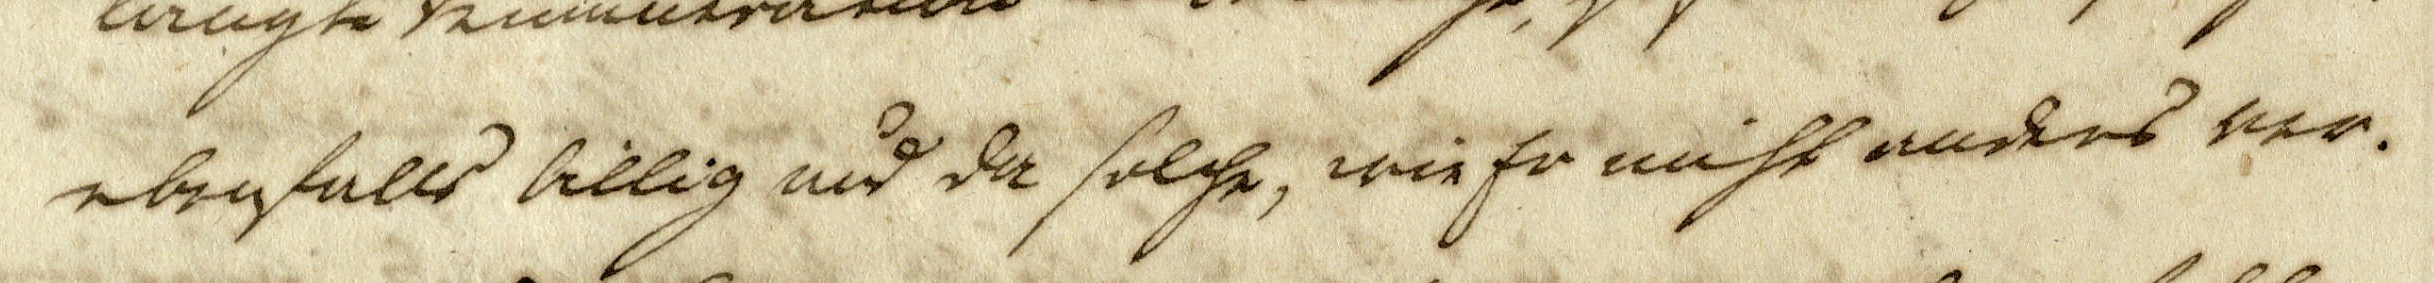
ebenfalls billig und da solche, wie Er nicht anders ver¬
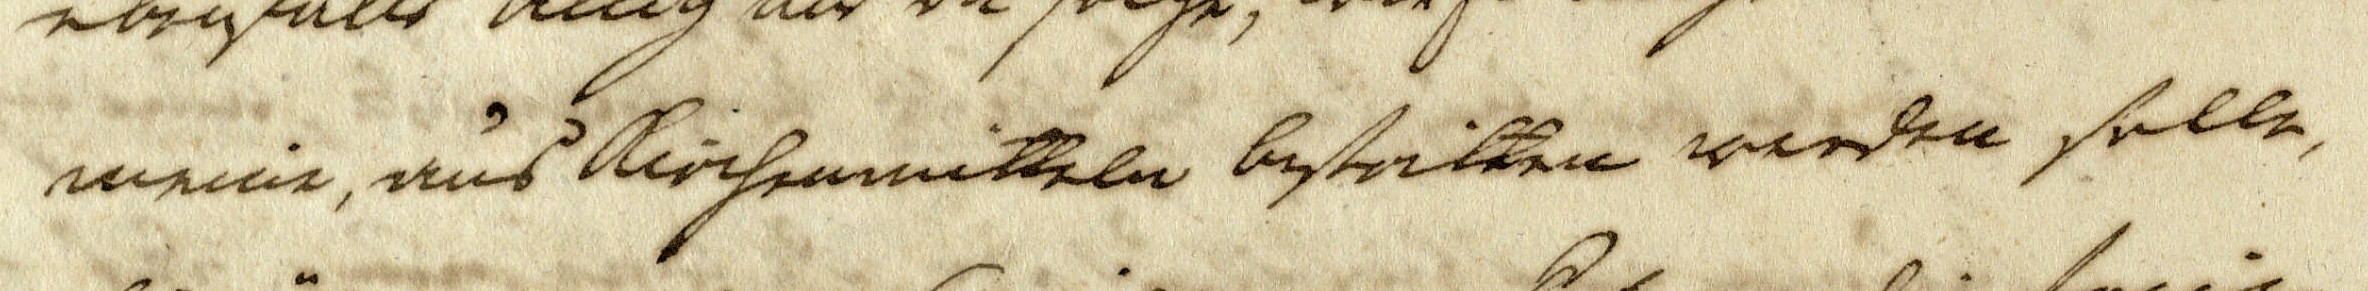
meine, aus Kirchenmitteln bestritten werden solle,
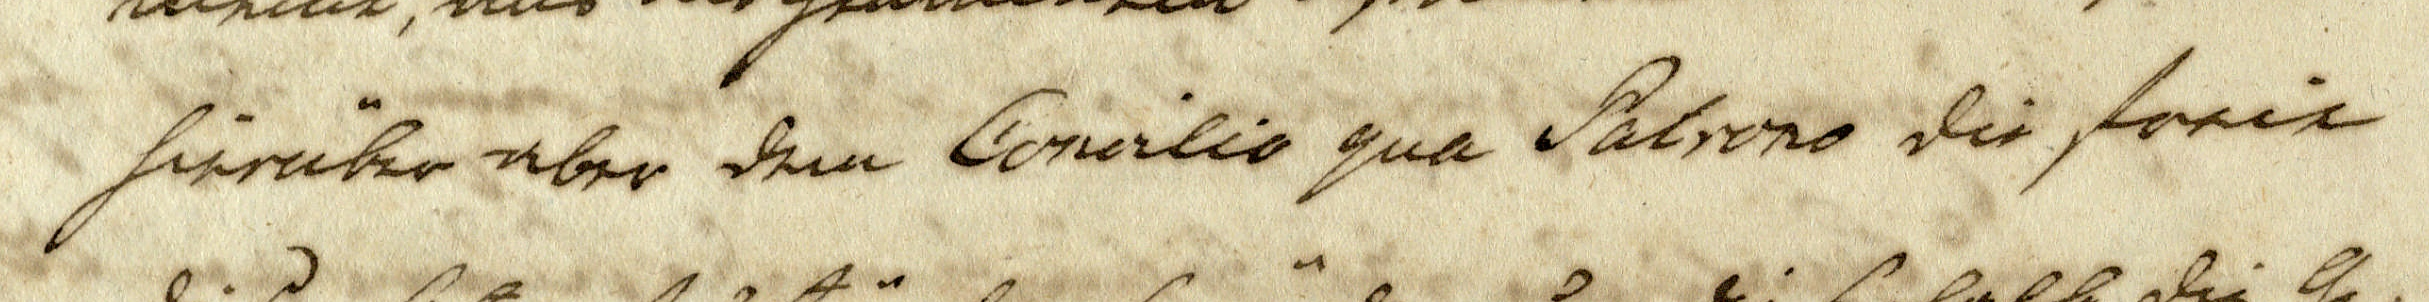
hierüber aber dem Concilio qua Patrono die freie
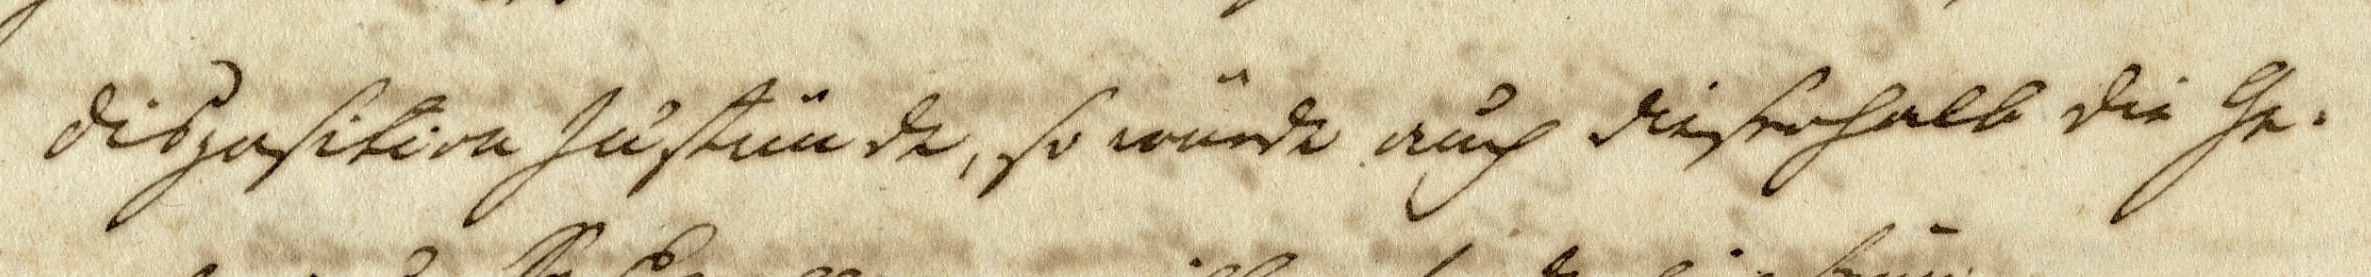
disposition zustünde, so würde auch dieserhalb die Ge¬
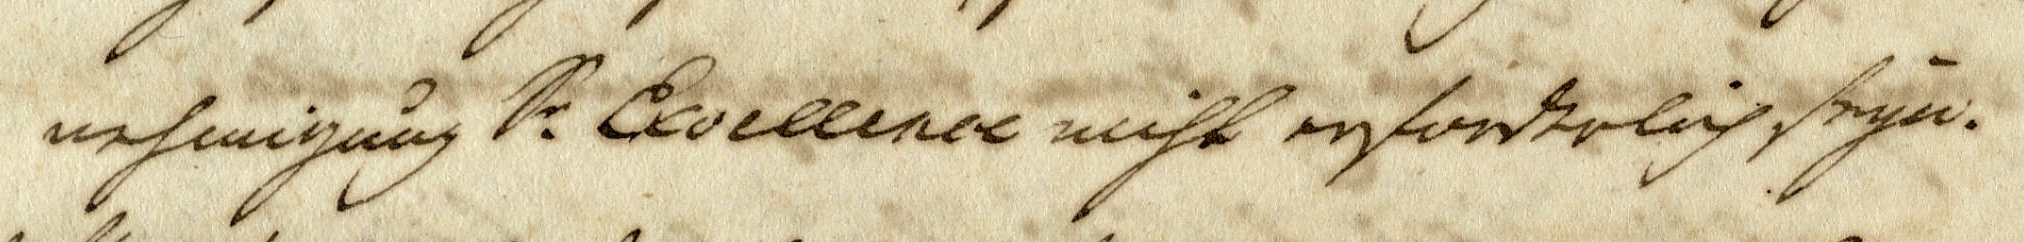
nehmigung Sr Excellence nicht erforderlich seÿn.
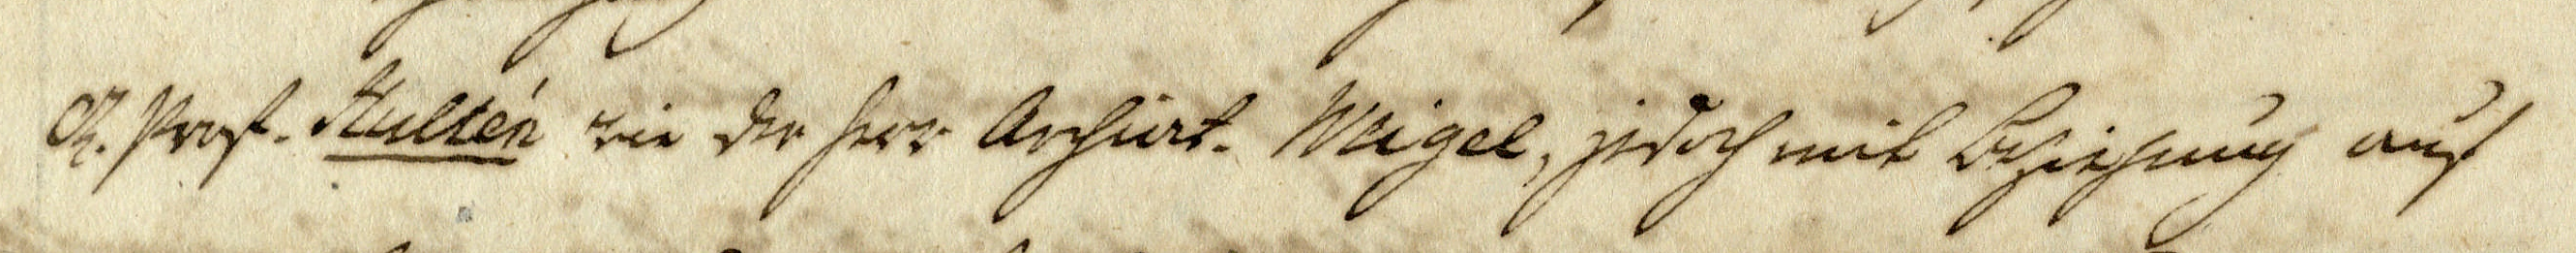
dh. Prof. Hultén wie der der Archiat. Weigel, jedoch mit Beziehung auf
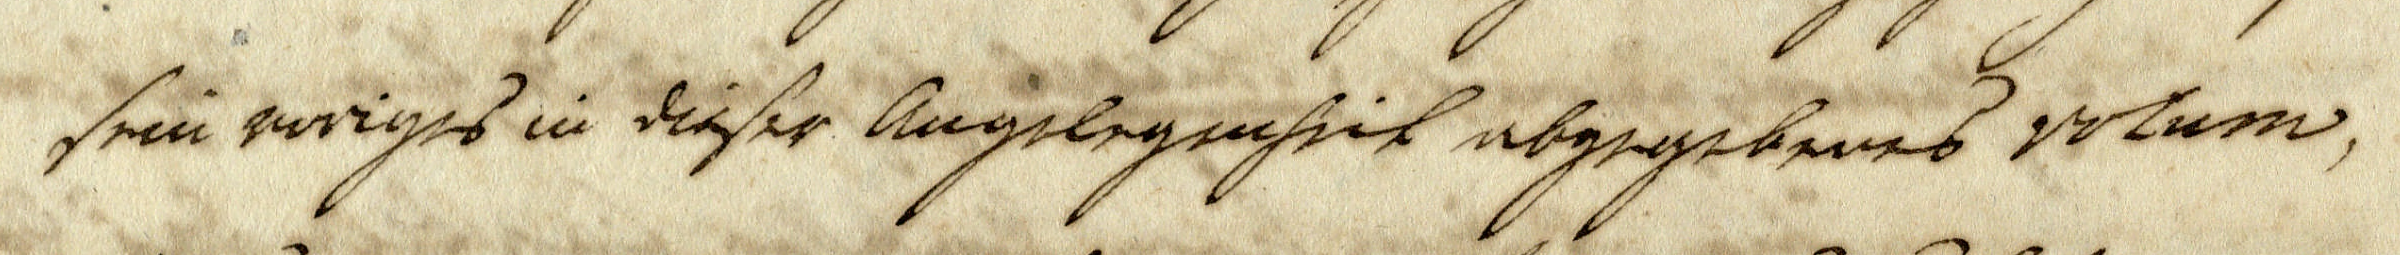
sein voriges in dieser Angelegenheit abgegebenes votum,
